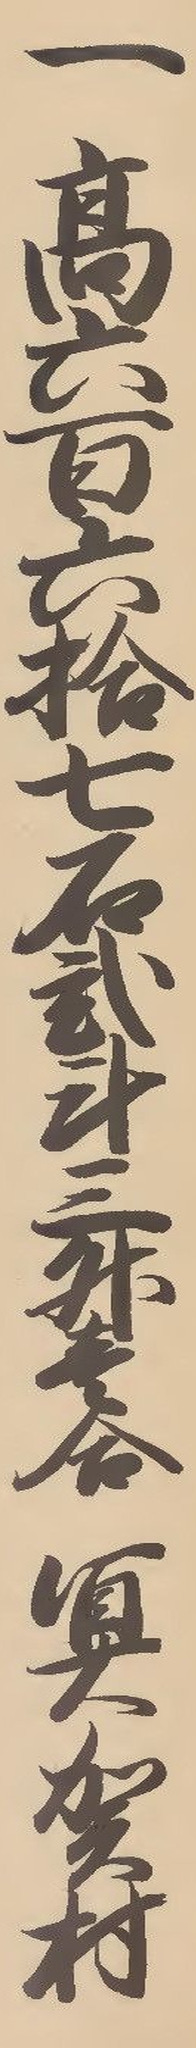一高六百六拾七石弐斗三升壱合冥賀村
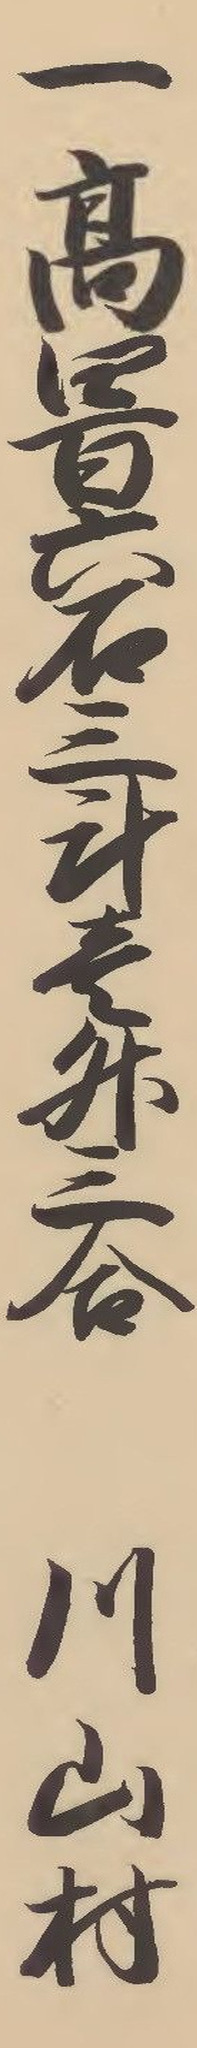一高四百六石三斗壱升三合川山村
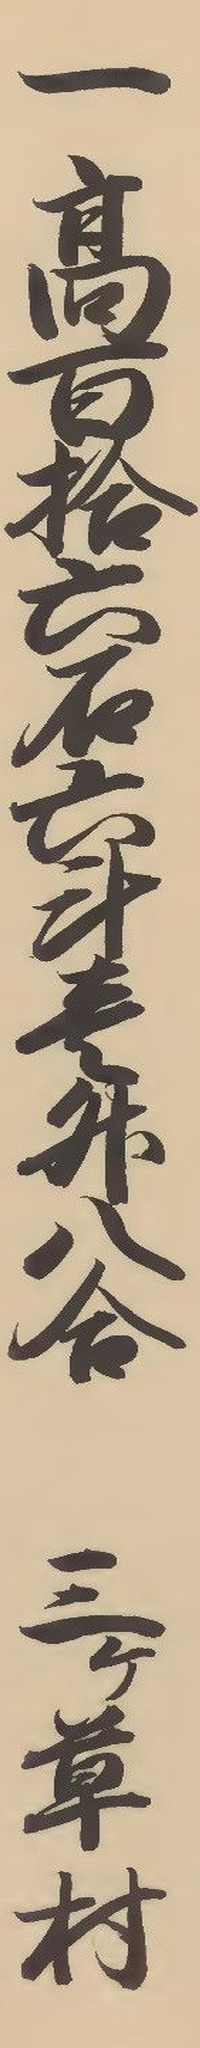一高百拾六石六斗壱升八合三ヶ草村
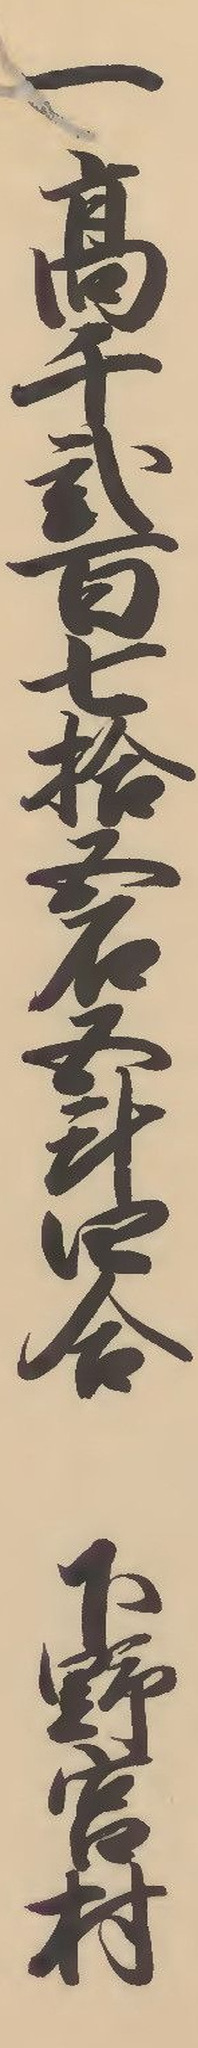一高千弐百七拾五石五斗四合下野宮村

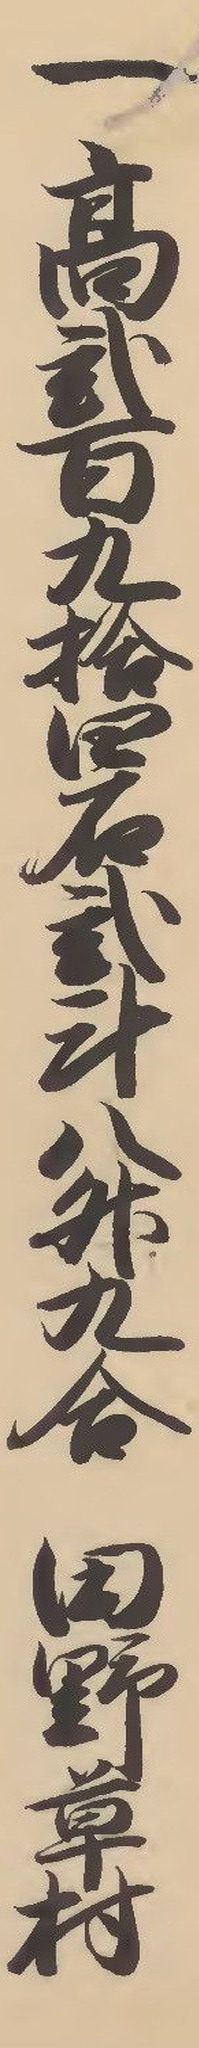一高弐百九拾四石弐斗八升九合田野草村
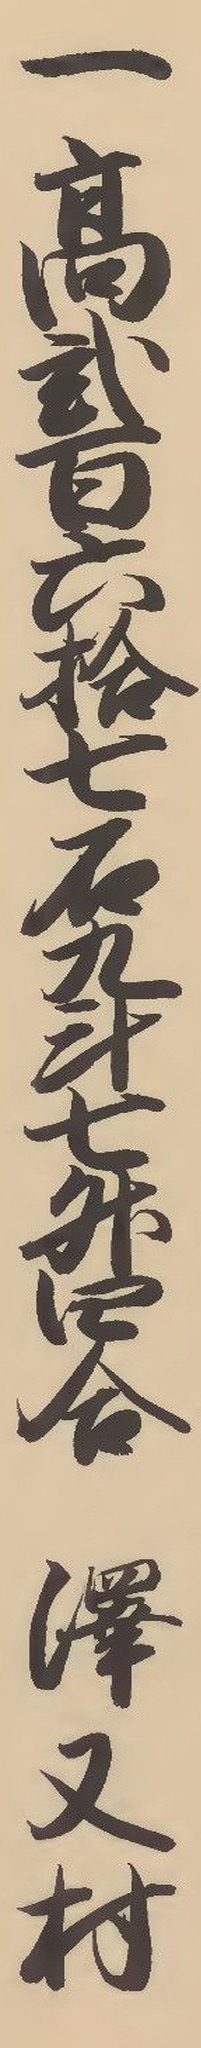一高弐百六拾七石九斗七升四合沢又村
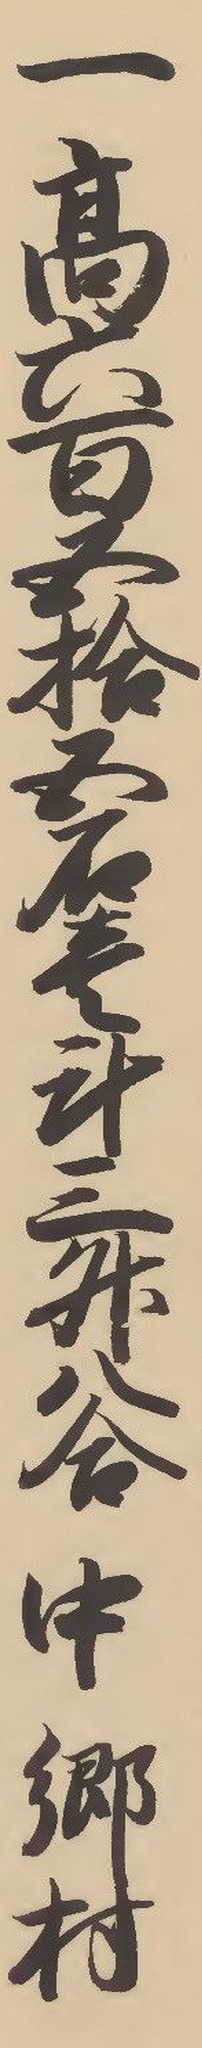一高六百五拾五石壱斗三升八合中郷村
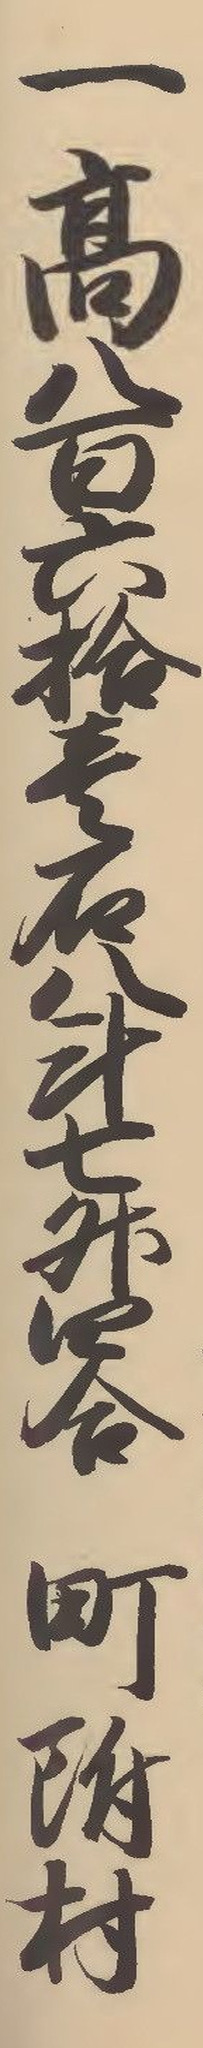一高八百六拾壱石八斗七升四合町附村
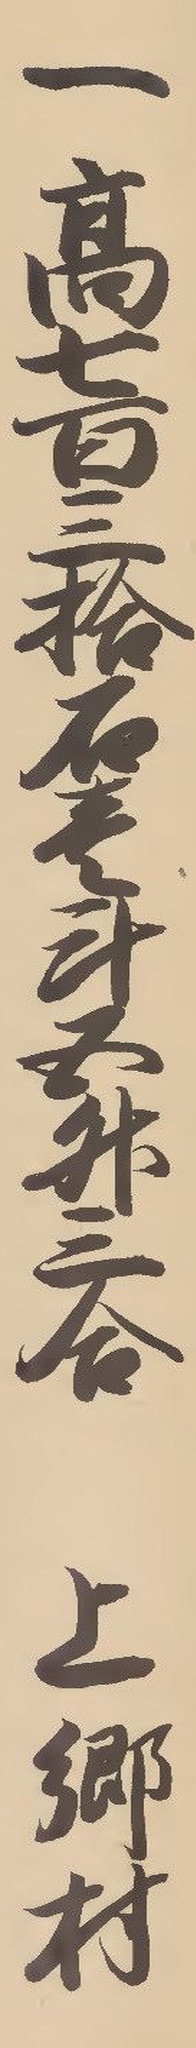一高七百三拾石壱斗五升三合上郷村
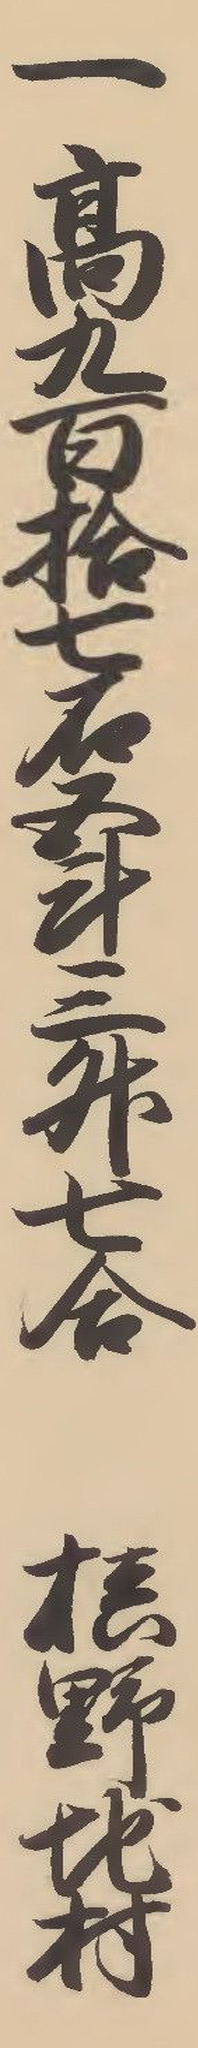一高九百拾七石五斗三升七合槙野地村
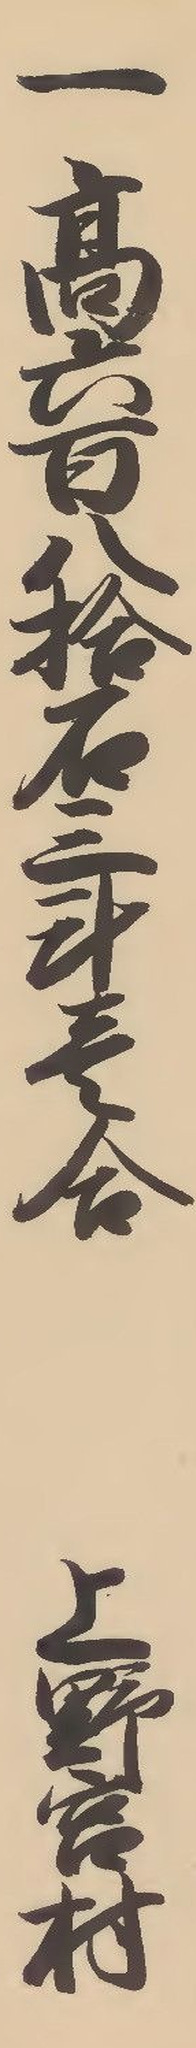一高六百八拾石三斗壱合上野宮村
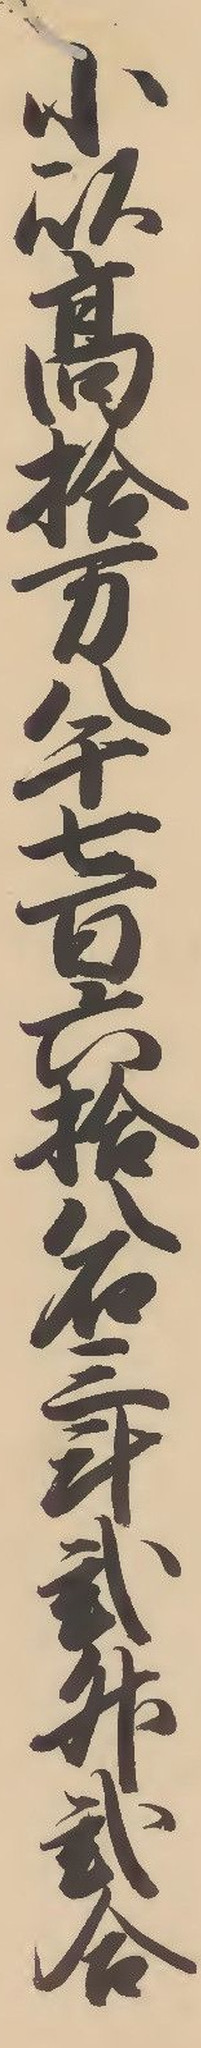小以高拾万八千七百六拾八石三斗弐升弐合

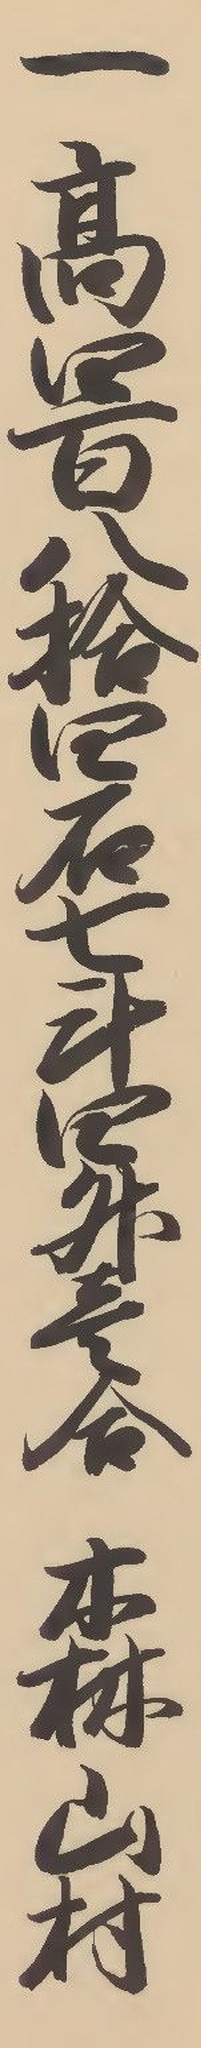一高四百八拾四石七斗四升壱合森山村
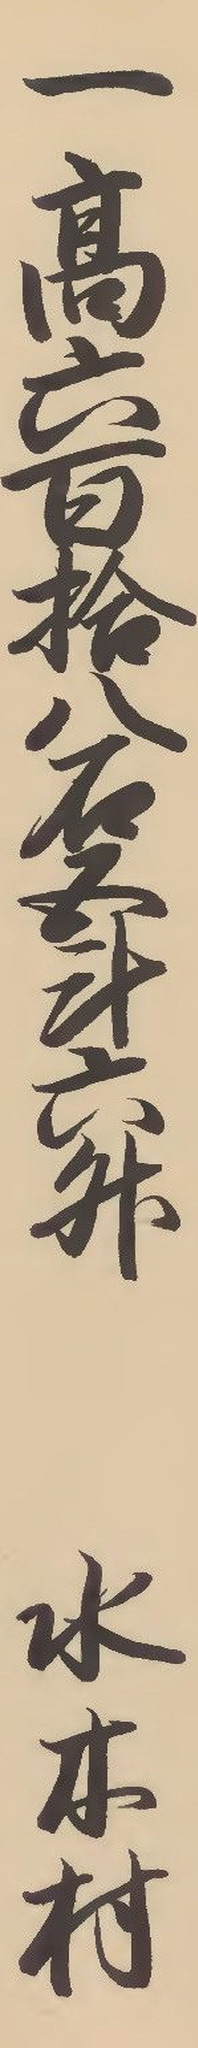一高六百拾八石五斗六升水木村
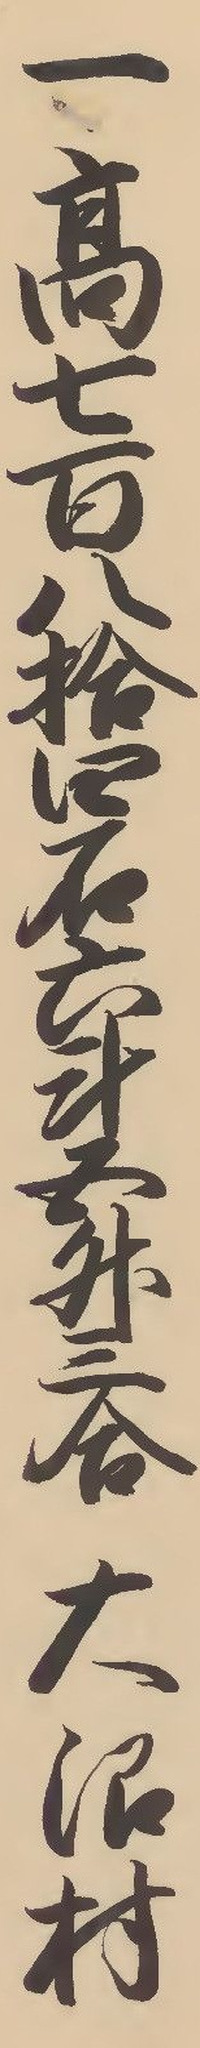一高七百八拾四石六斗五升三合大沼村

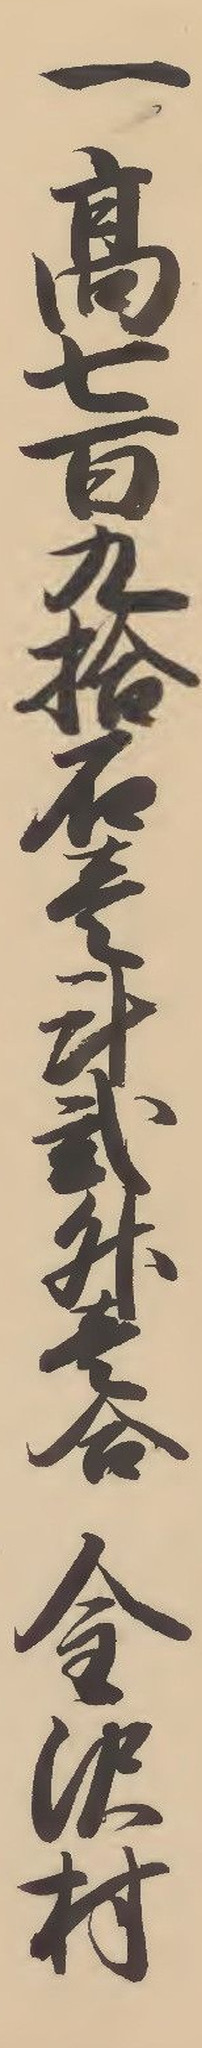一高七百九拾石壱斗弐升壱合金沢村
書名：常陸国郷帳
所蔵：国立公文書館 National Archives of Japan
